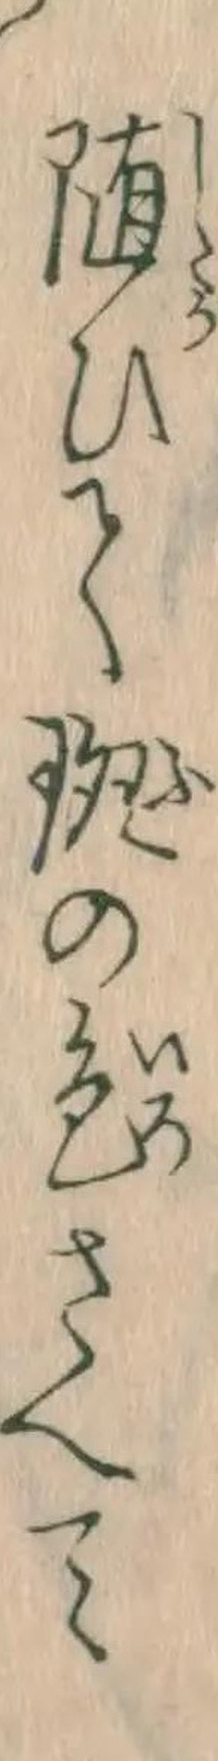随ひて斑の色さへて
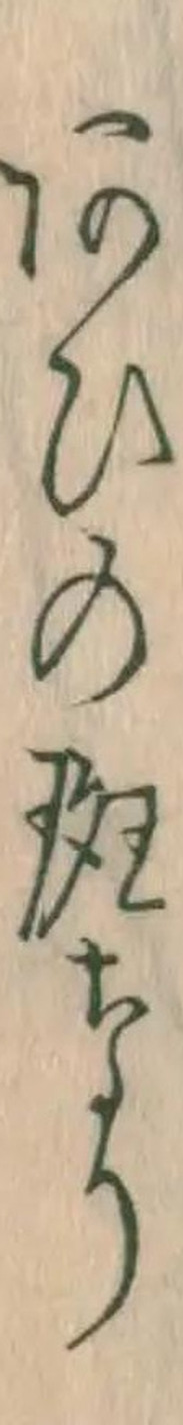あひの斑なり
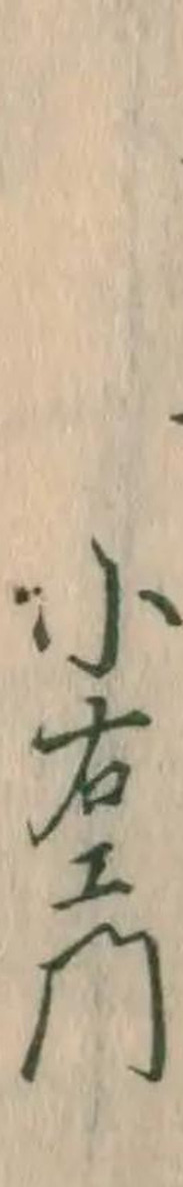小右エ門
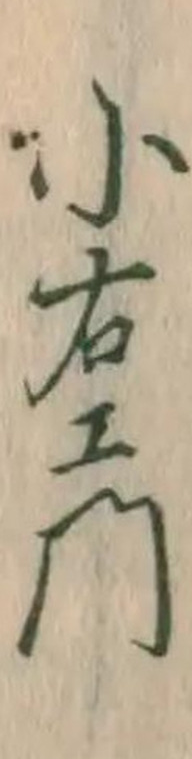小右エ門
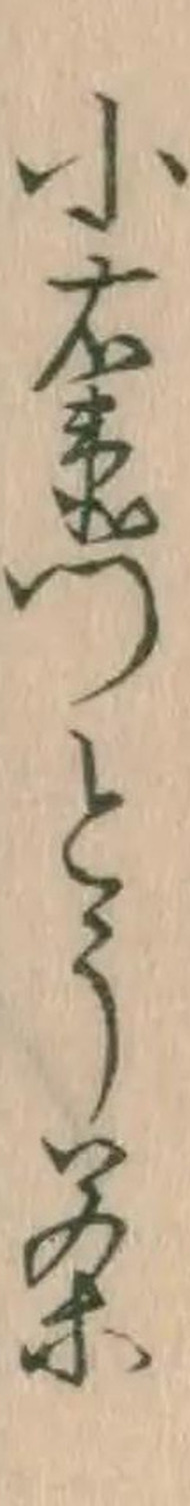小右衛門とう茶
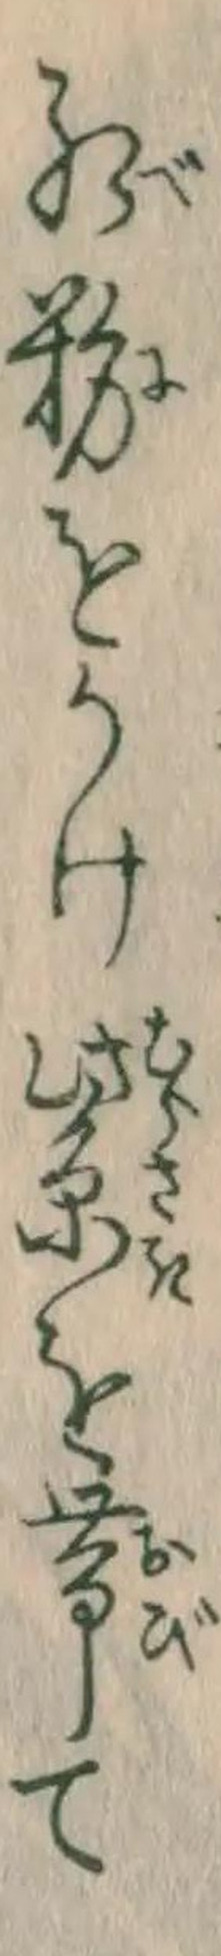紅粉をかけ紫を帯て
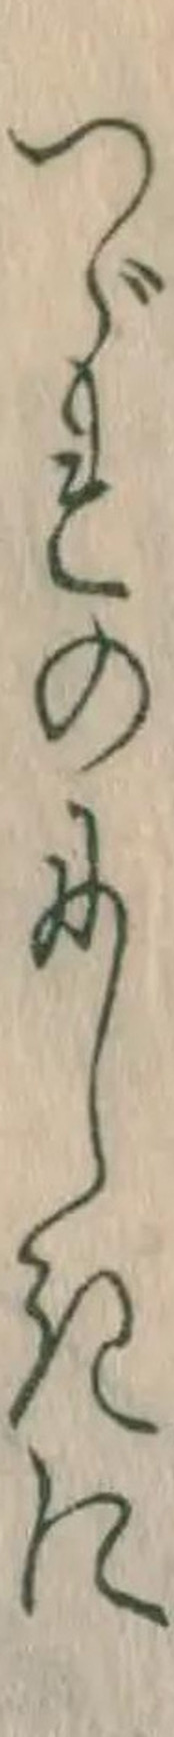つゞれのにしきに
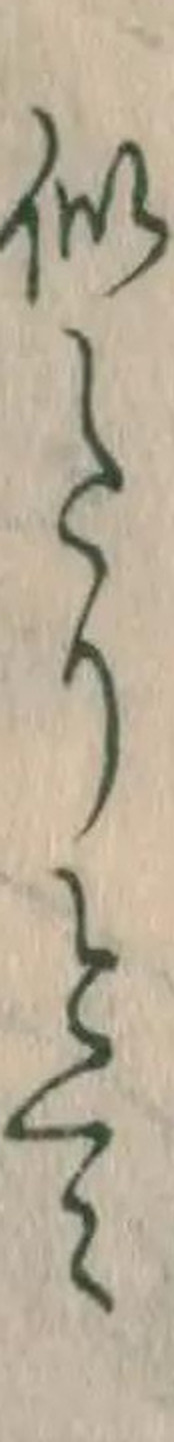似たりとて
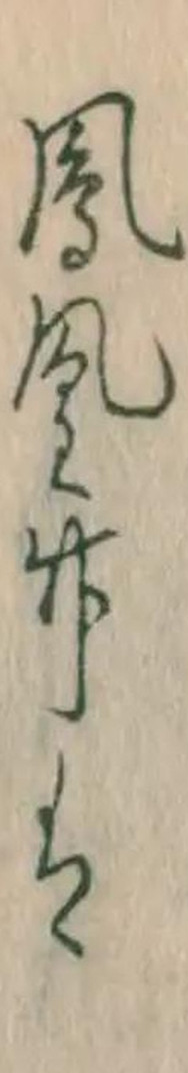鳳凰竹は
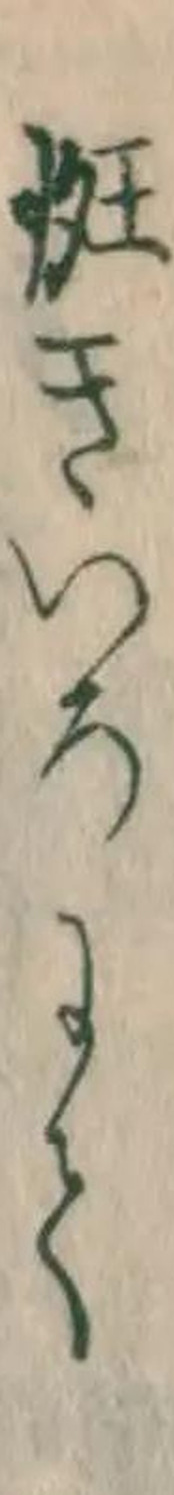斑きいろにて
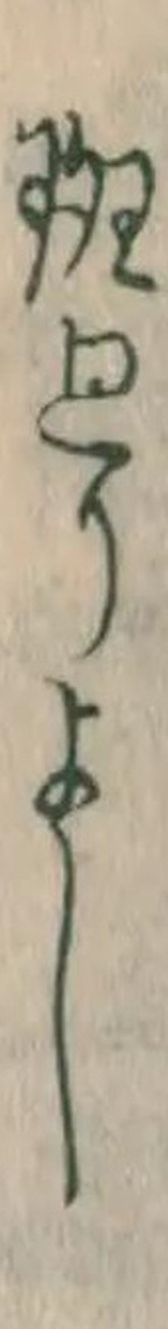斑廻りよし
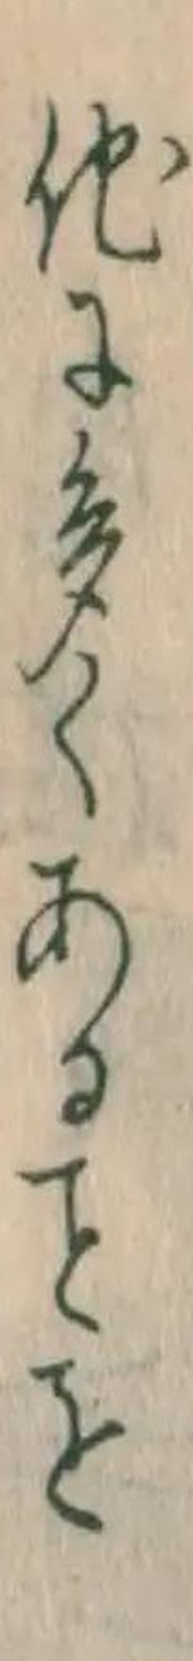他に多くあることを
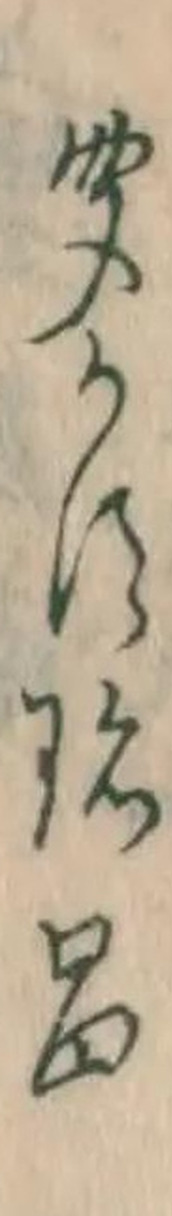聞かす珍品
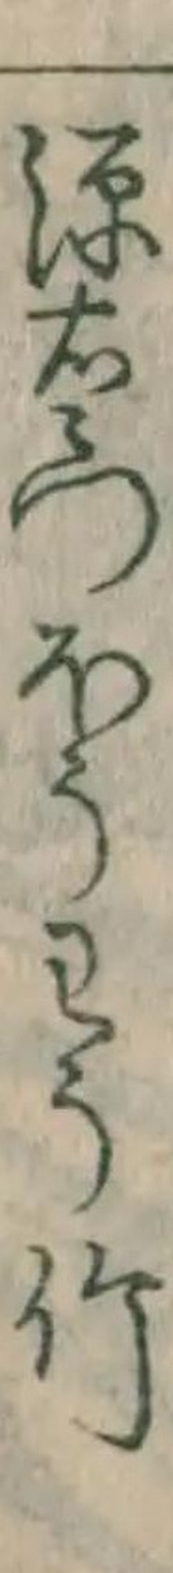源右衛門ほうわう竹

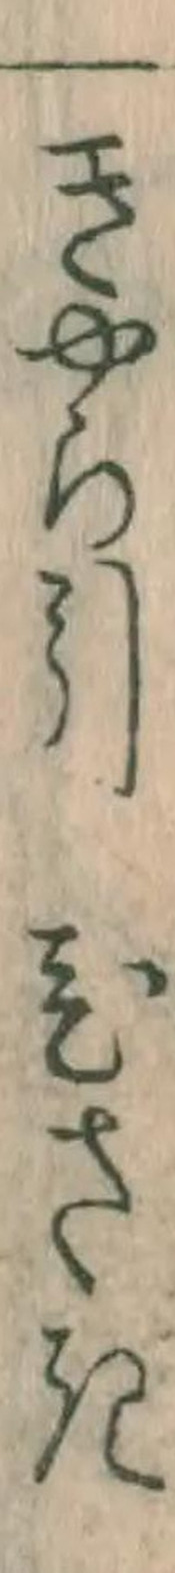きやら引ひさき
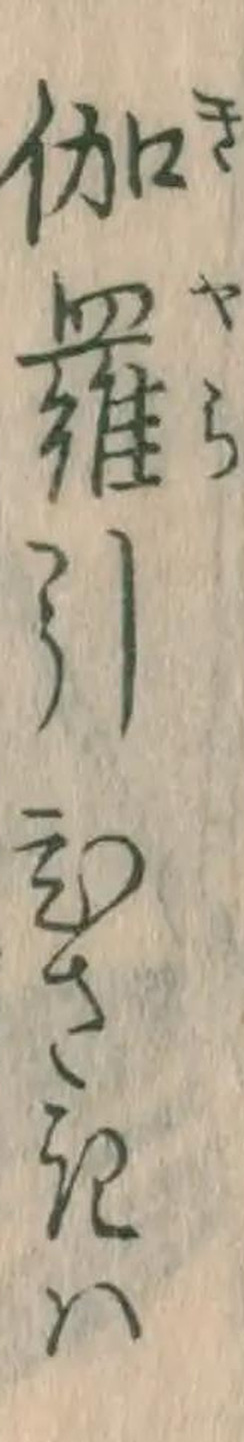伽羅引ひさきは
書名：草木奇品家雅見 3巻. [3]
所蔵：国立国会図書館 National Diet Library, JAPAN
